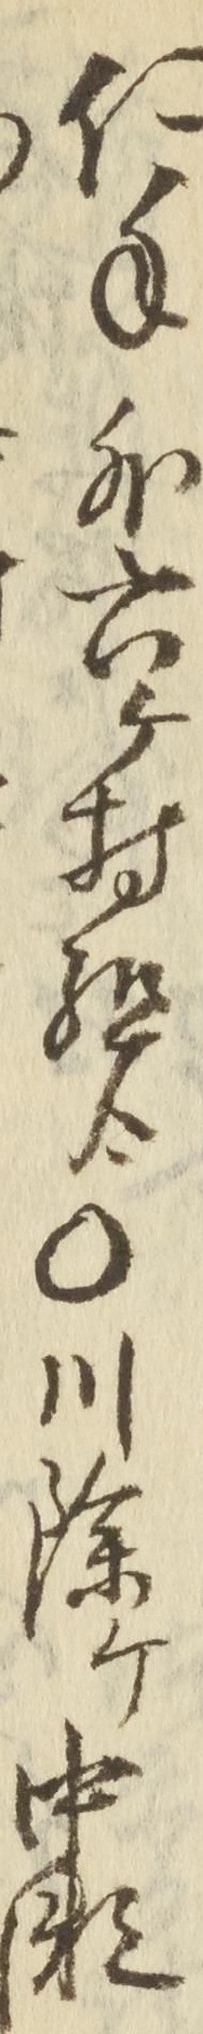仁手外六ケ村組合◯川除中瀬
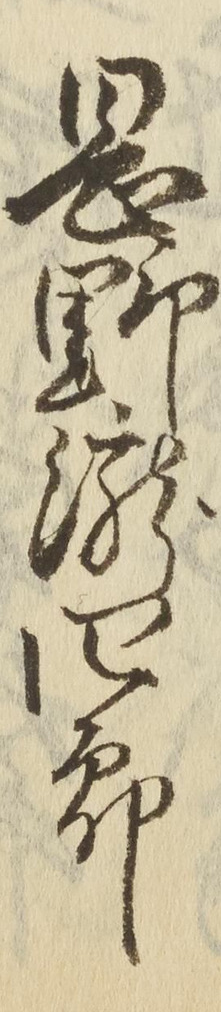岡野滝四郎
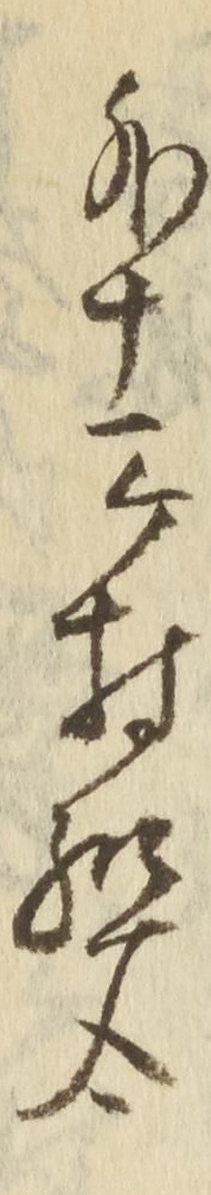外十一ケ村組合
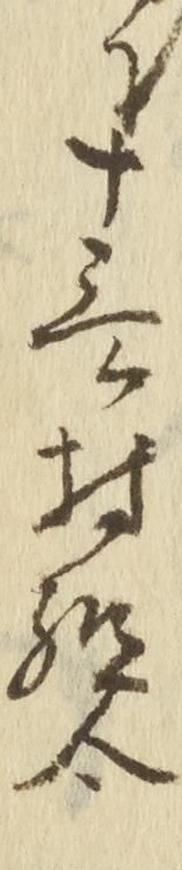十三ヶ村組合
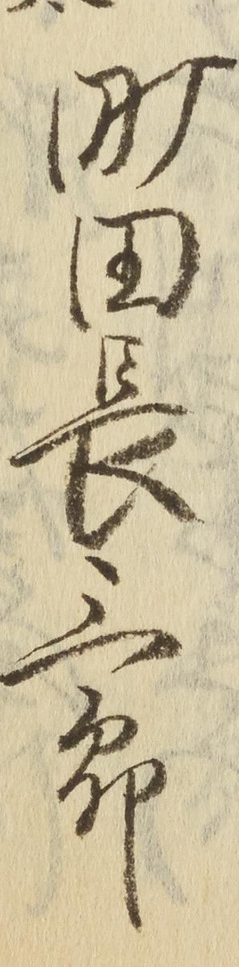町田長三郎
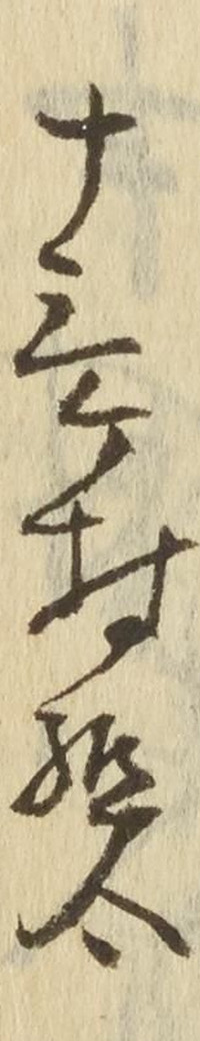十三ヶ村組合
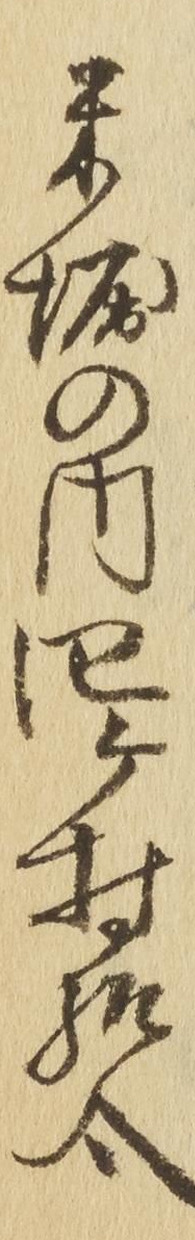米堀の内四ヶ村組合

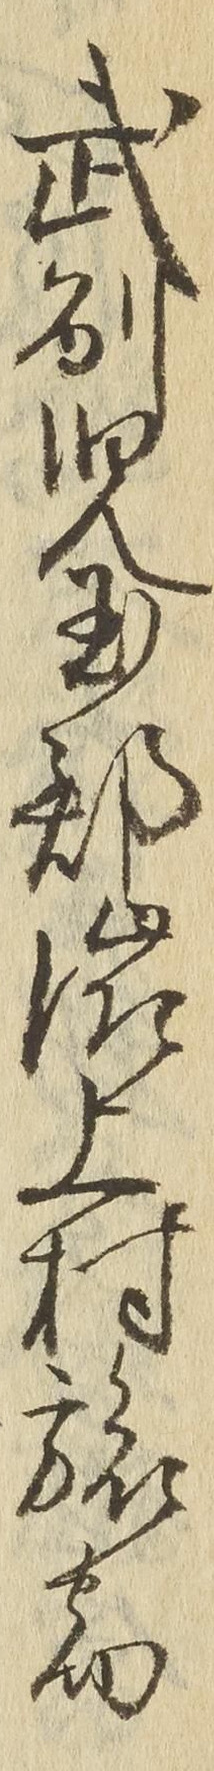武州児玉郡渋上村旅宿
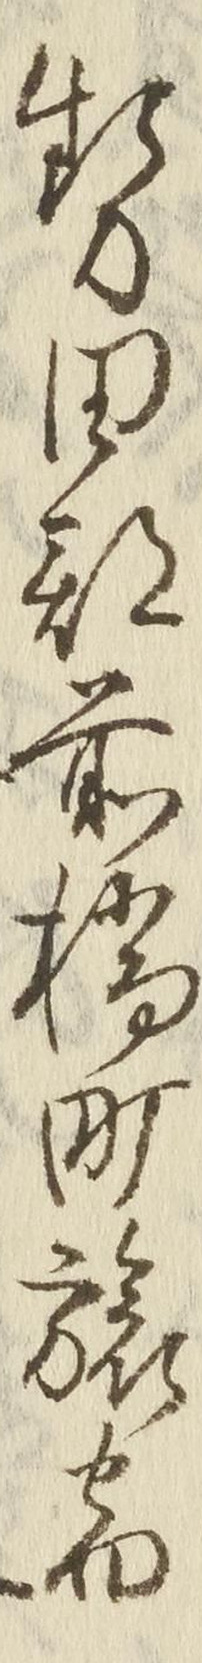勢田郡前橋町旅宿
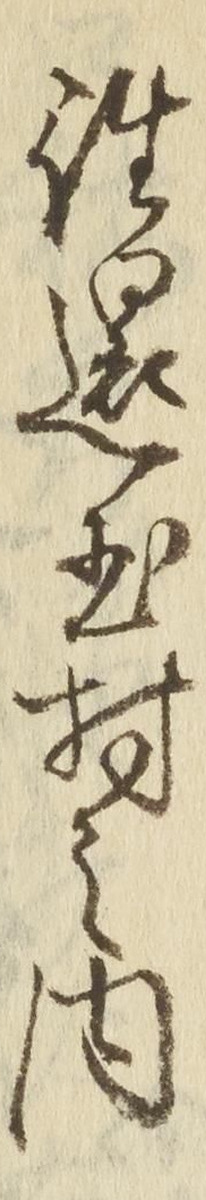往還玉村の内
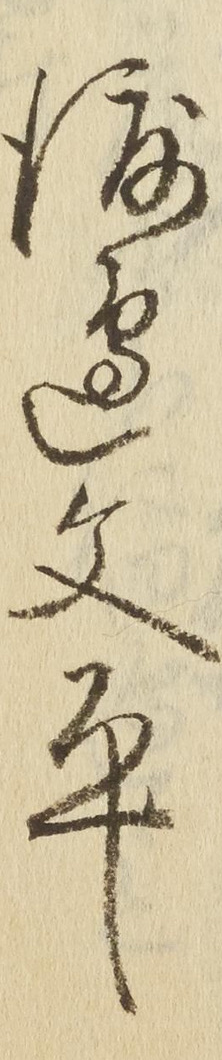渡辺文平
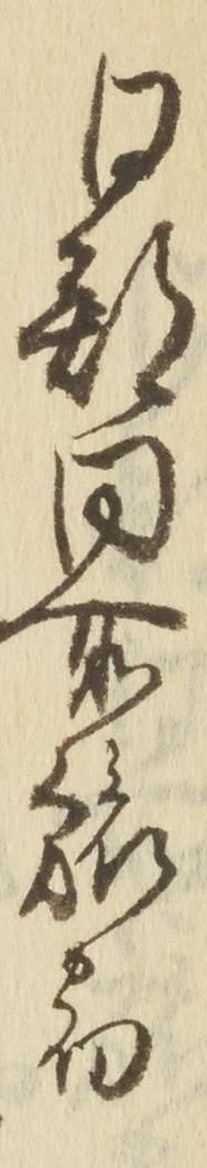同郡同所旅宿
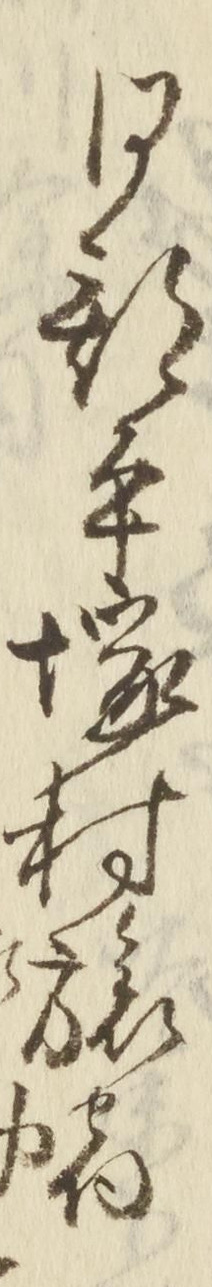同郡平塚村旅宿
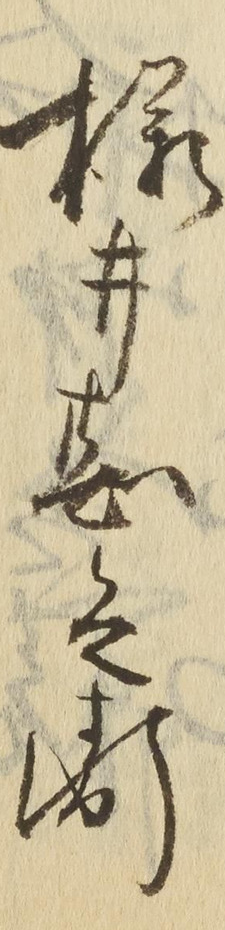桜井甚兵衛

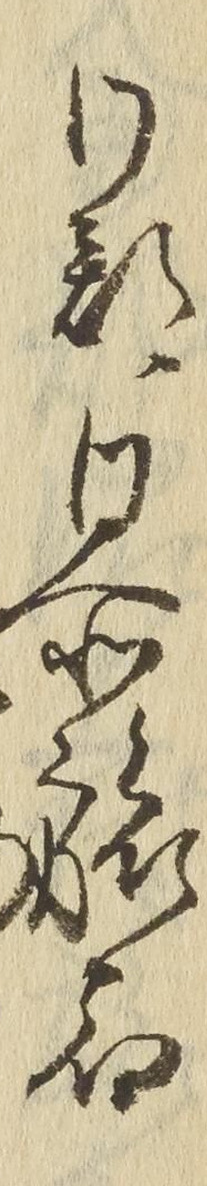同郡同所旅宿
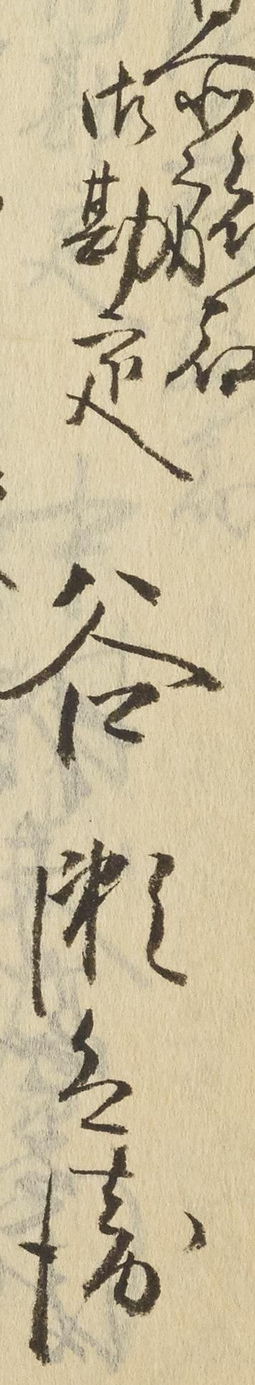御勘定谷瀬兵衛
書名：浅間大變記
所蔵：東京大学地震研究所図書室 Earthquake Research Institute Library, The University of Tokyo, JAPAN
